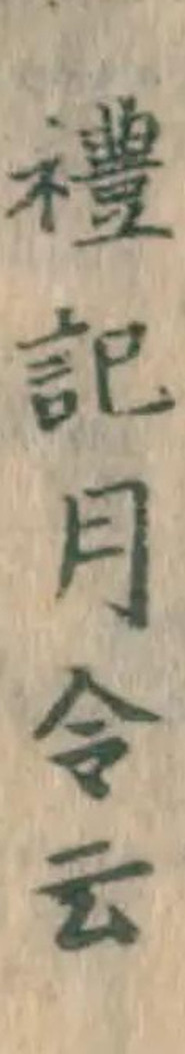礼記月令云
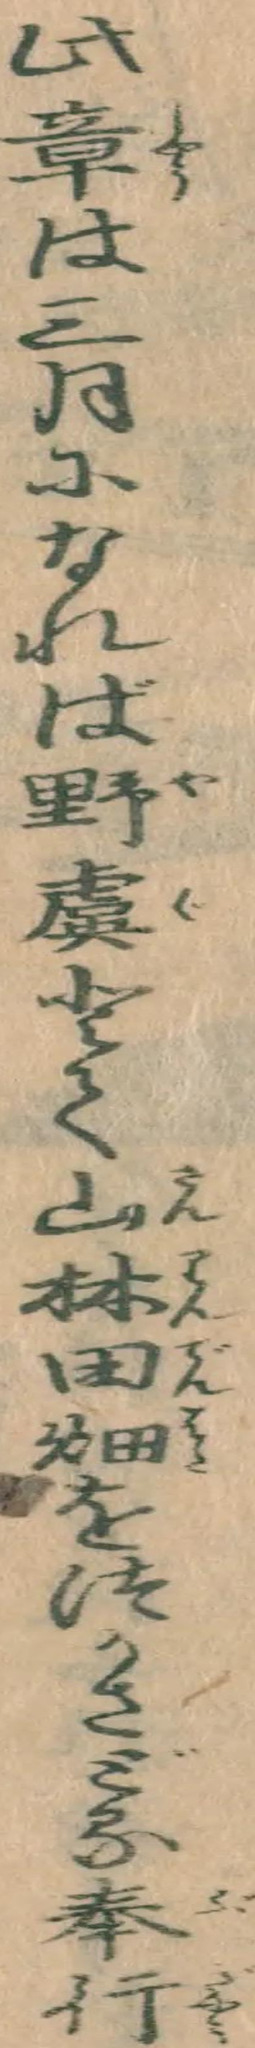此章は三月になれば野虞とて山林田畑をつかさどる奉行
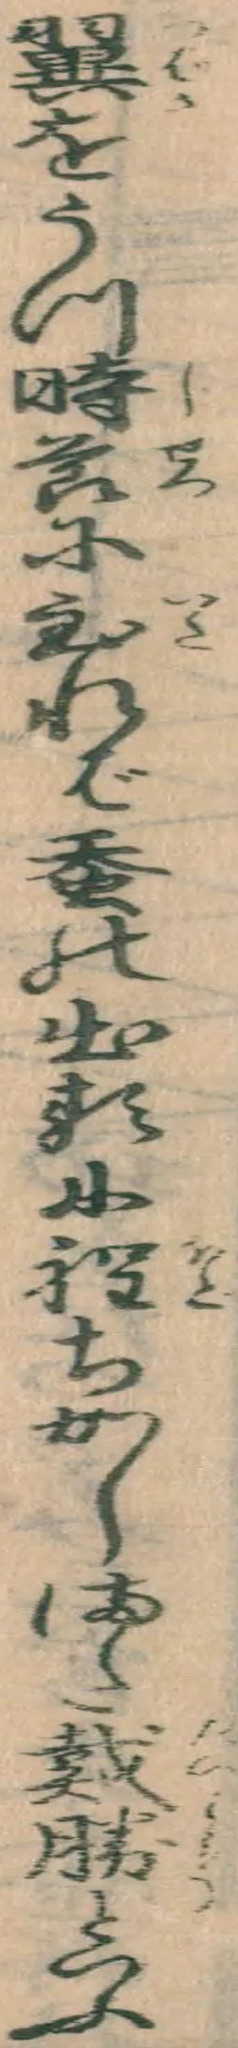翼をうつ時節に至れば蚕の出るに程ちかしまた戴勝といふ
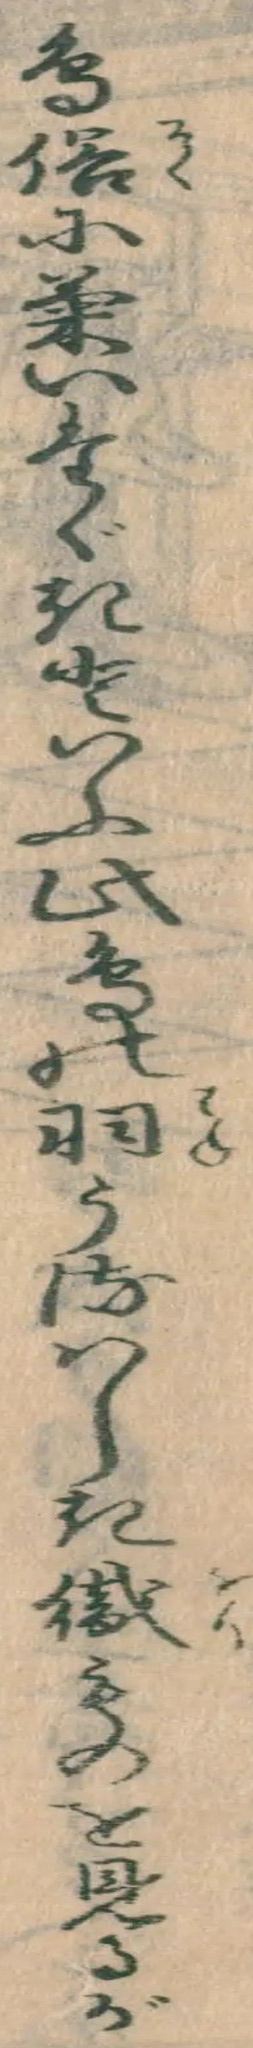鳥俗に菊いたゞきといふ此鳥の羽うるはしき織ものを見るが
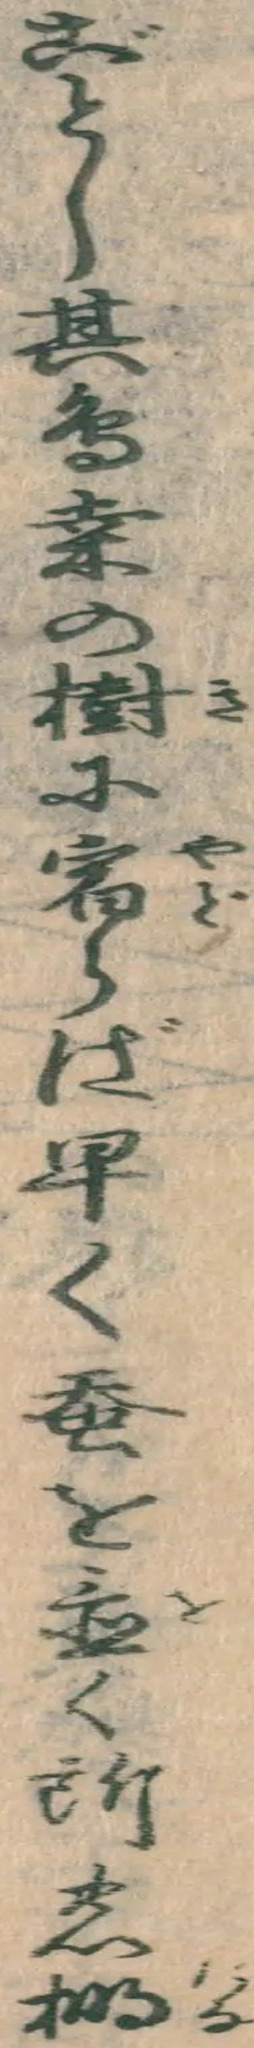ごとし其鳥桑の樹に宿らば早く蚕を置く所の棚
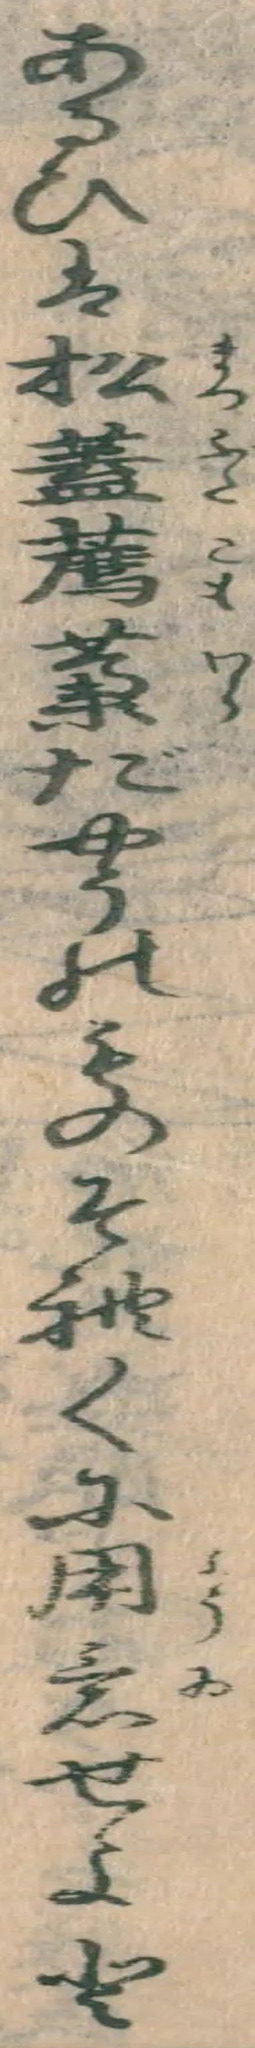あるひは松蓋薦藁だやうのものそれ〳〵に用意せよと
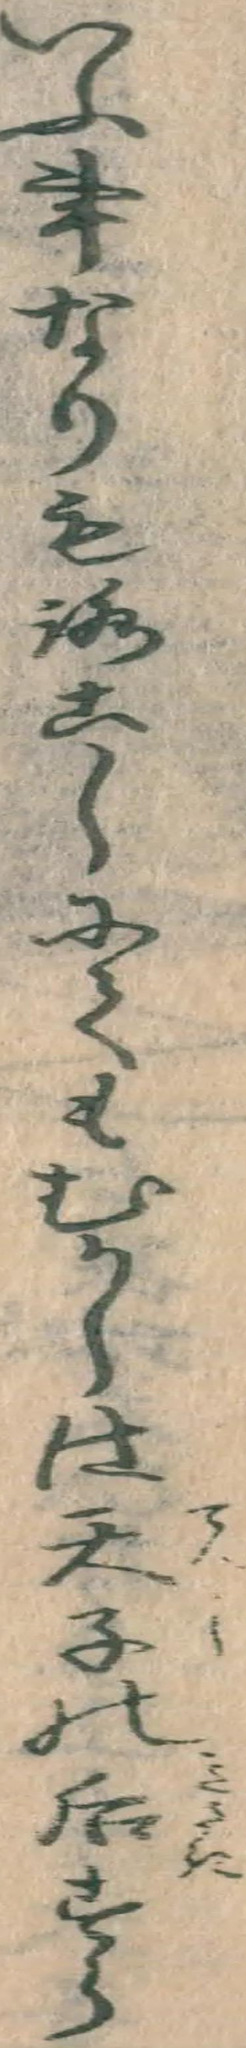いふ事なりもろこしにてもむかしは天子の后すら
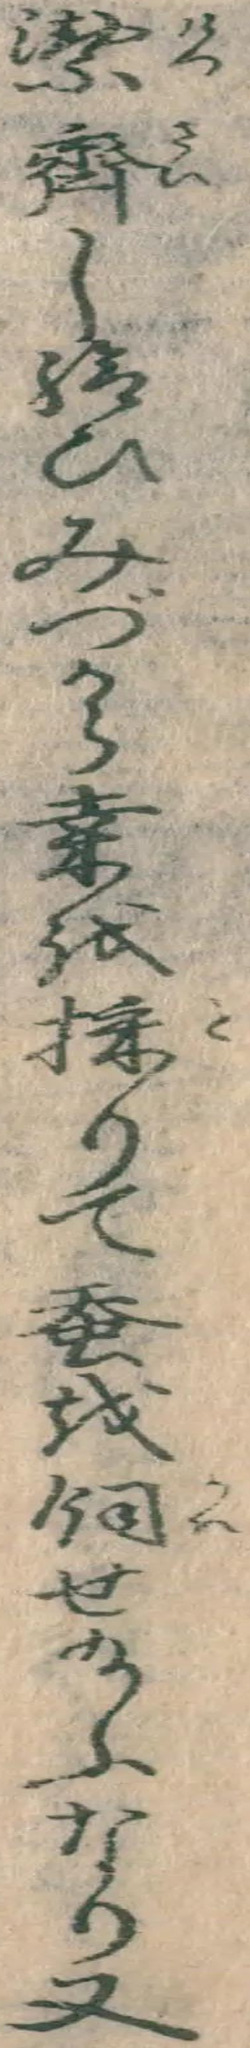潔斉し給ひみづから桑を採りて蚕を飼せ給ふなり又
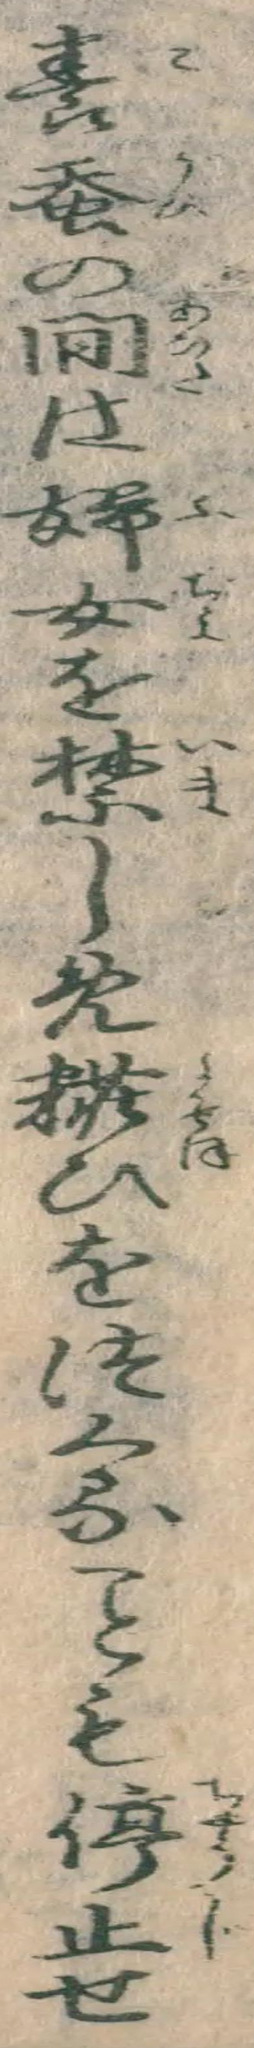養蚕の間は婦女を禁しめ粧ひをつくることも停止せ
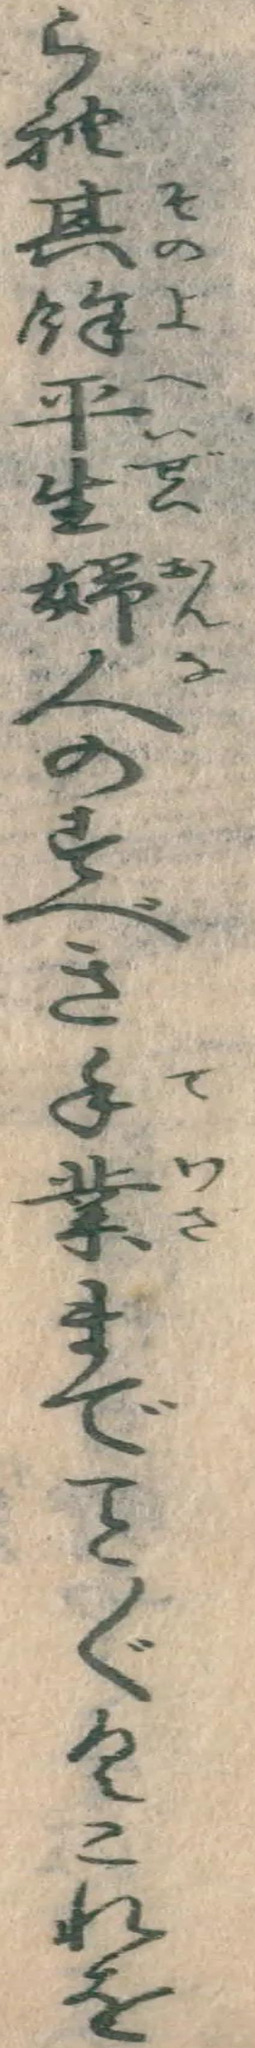られ其余平生婦人のすべき手業までこと〴〵くこれを
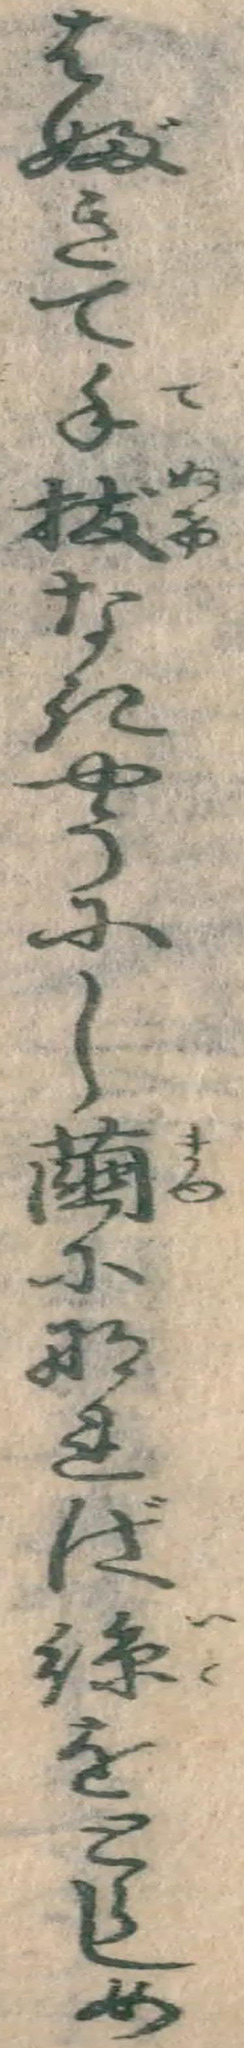はぶきて手抜なきやうにし繭になれば糸をとらしめ
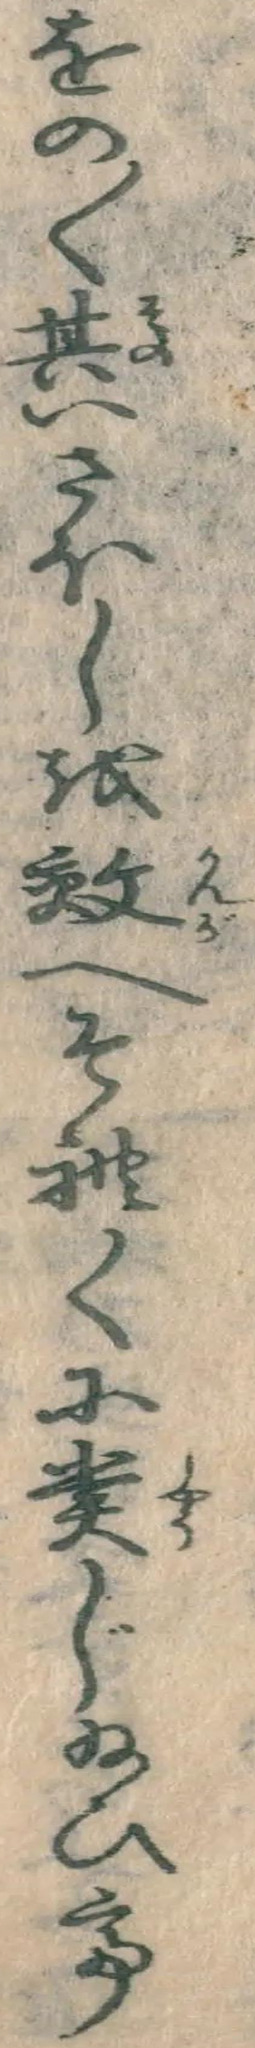をの〳〵其いさほしを攷へそれ〳〵に賞じ給ひて
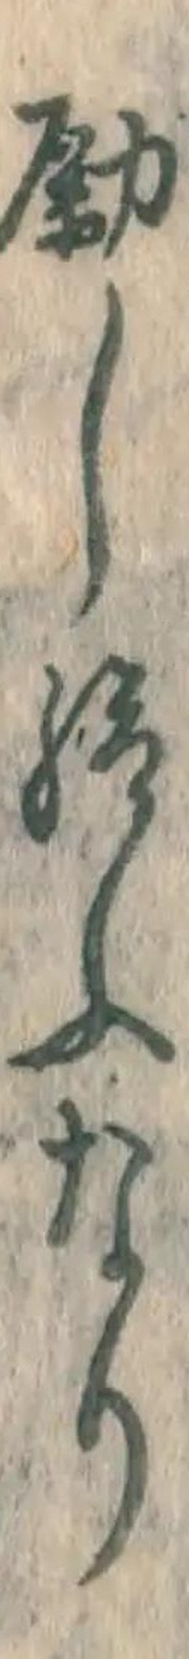励し給ふなり

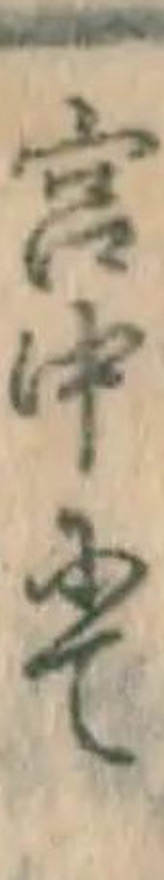宮中にて
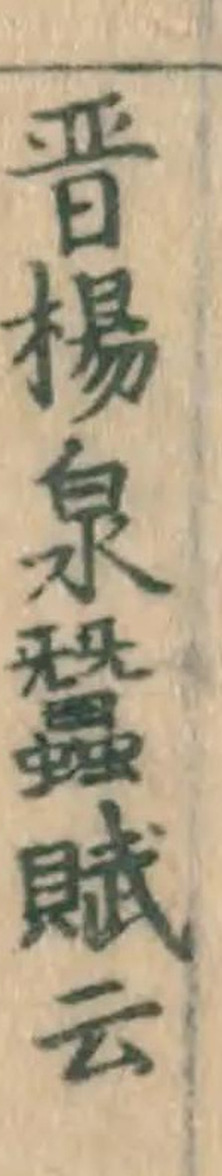晋楊泉蚕賦云
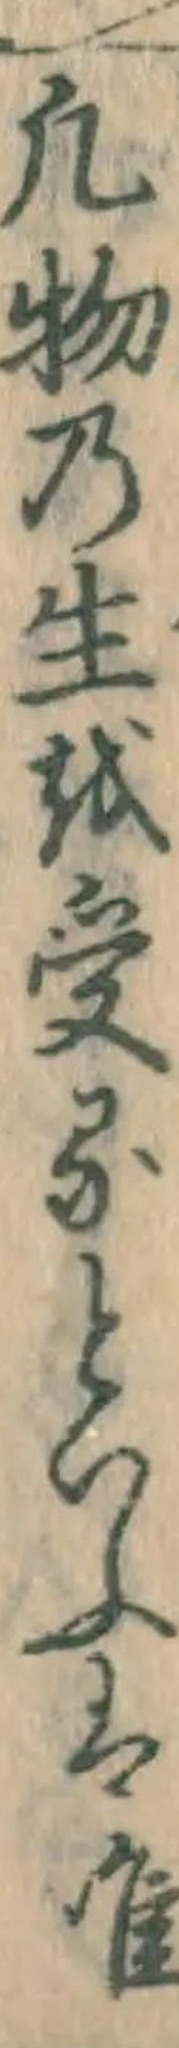凡物の生を受るといふは唯
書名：養蚕秘録 3巻. [1]
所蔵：国立国会図書館 National Diet Library, JAPAN
